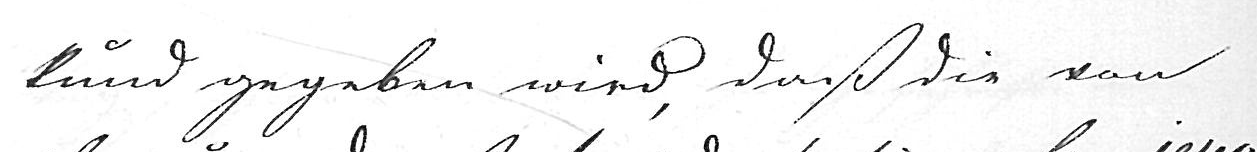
kund gegeben wird, daß die von
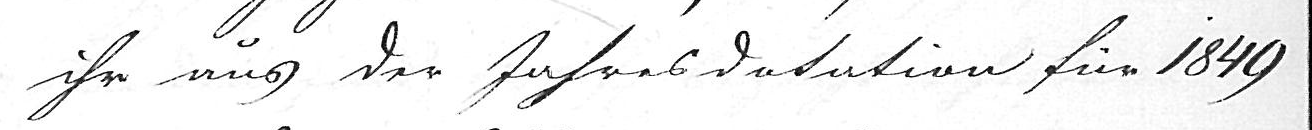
ihr aus der Jahresdotation für 1849
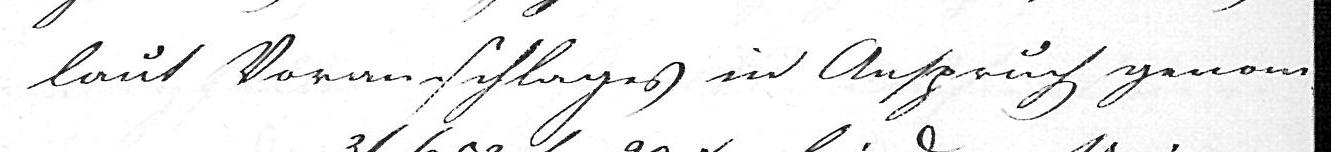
laut Voranschlages in Anspruch genom-
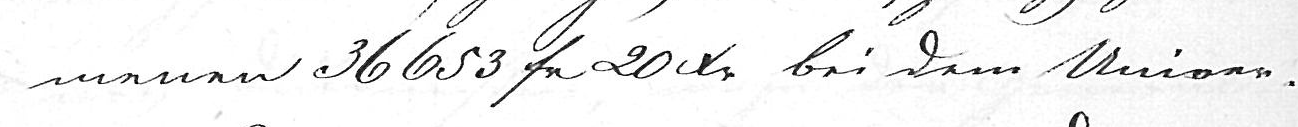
menen 36653 fr 20 kr bei dem Univer-
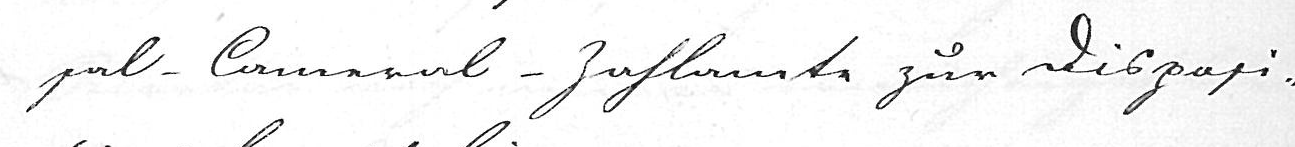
sal-Cameral-Zahlamte zur Disposi-
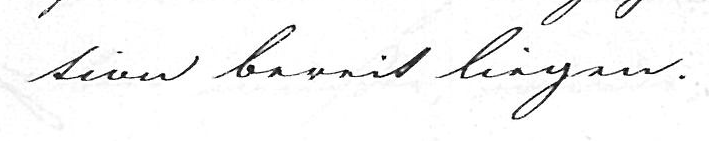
tion bereit liegen.
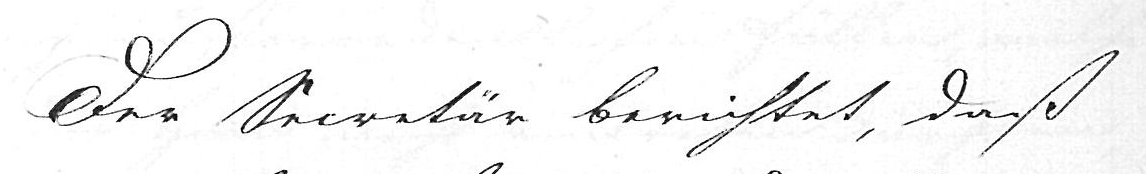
Der Secretär berichtet, daß
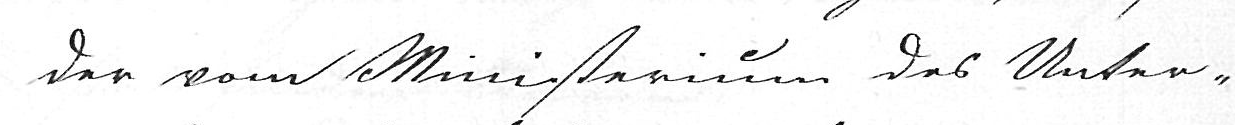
der vom Ministerium des Unter-
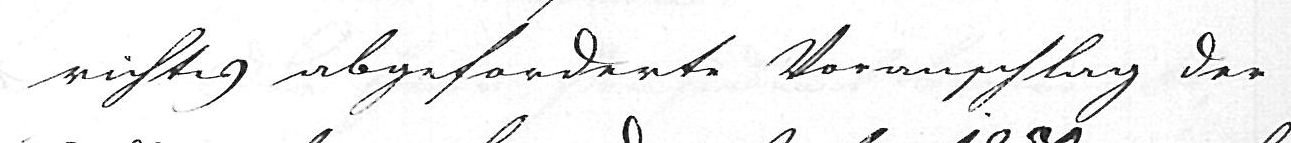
richtes abgeforderte Voranschlag der
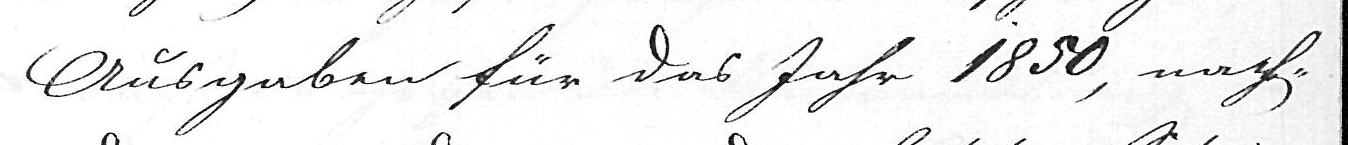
Ausgaben für das Jahr 1850, nach-
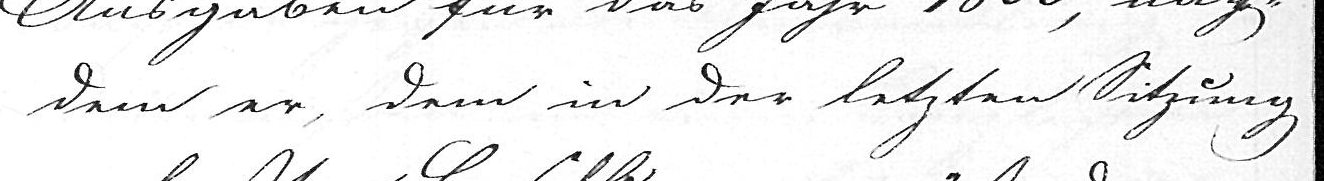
dem er, dem in der letzten Sitzung
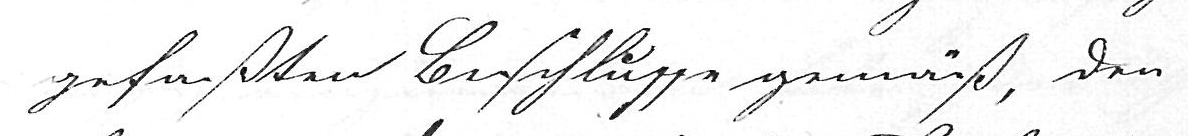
gefaßten Beschlusse gemaß, den
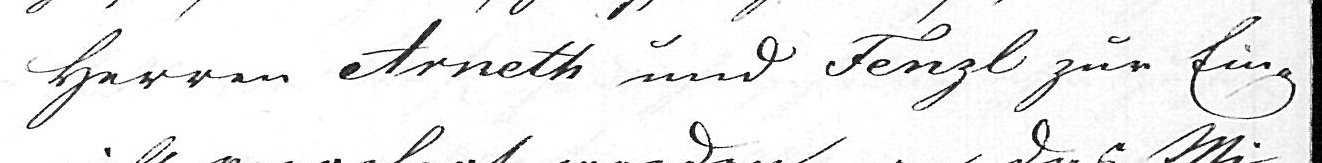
Herren Arneth und Fenzl zur Ein-
